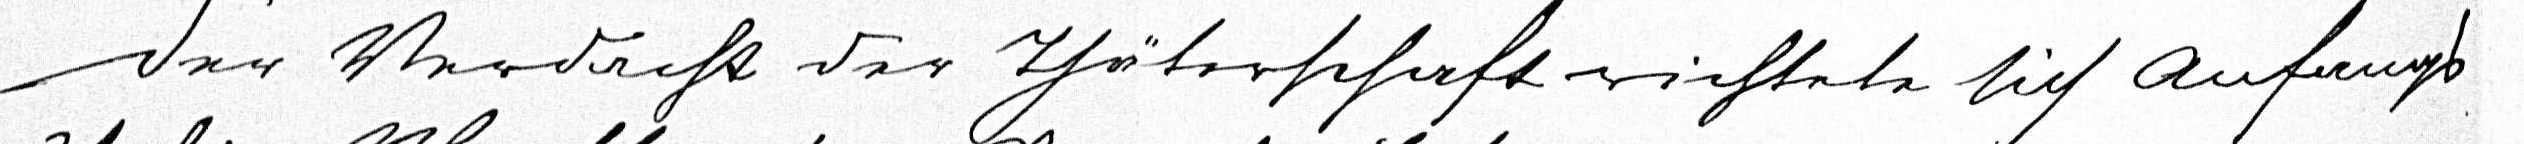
Der Verdacht der Thäterschaft richtete sich Anfangs
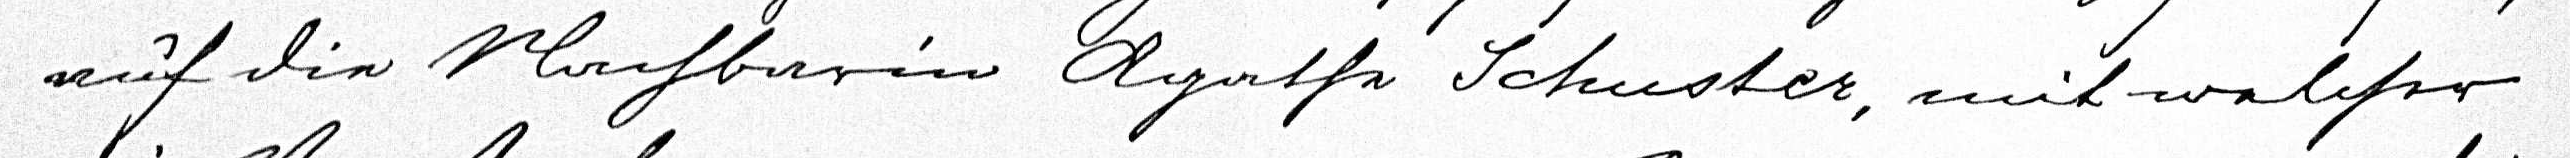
auf die Nachbarin Agathe Schuster, mit welcher
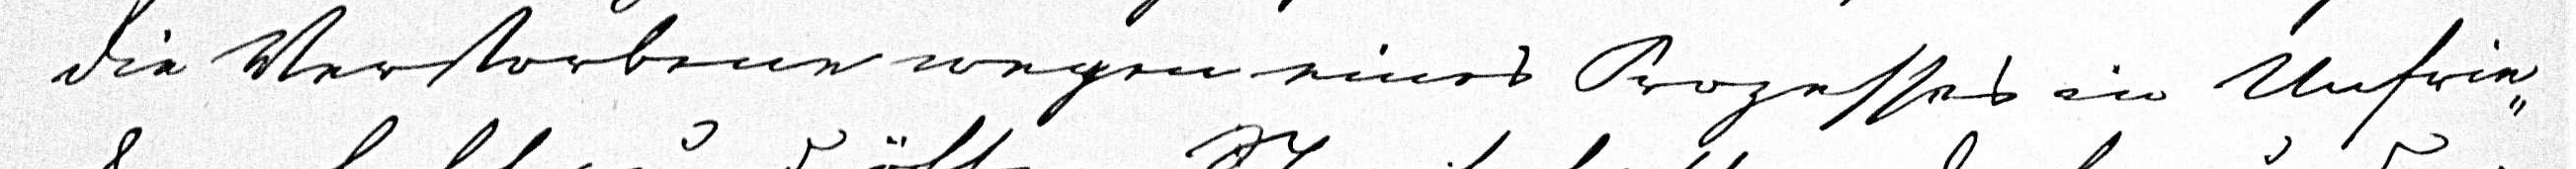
die Verstorbene wegen eines Prozesses in Unfrie¬
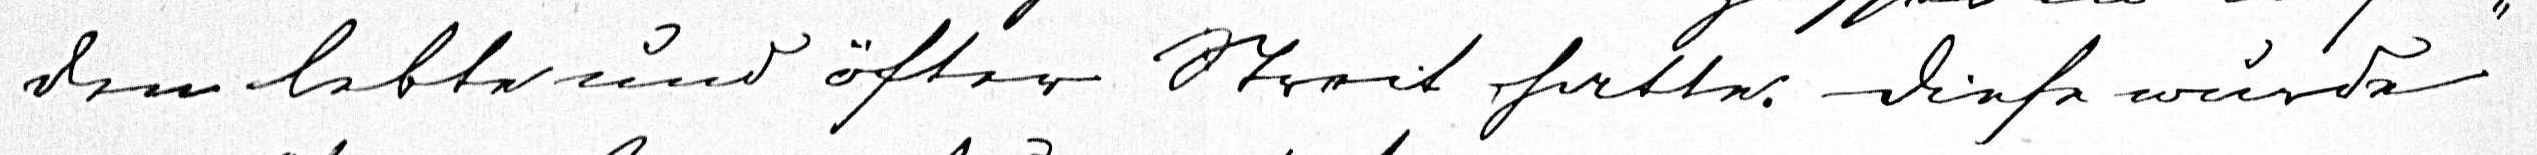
den lebte und öfter Streit hatte. Diese wurde
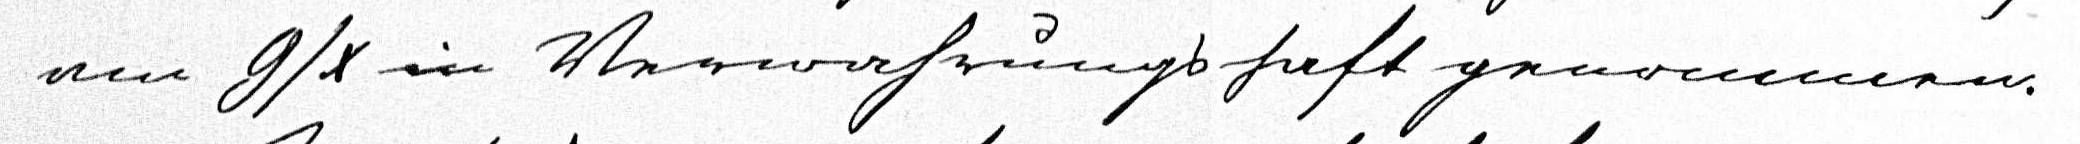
am 9/X in Verwahrungshaft genommen.
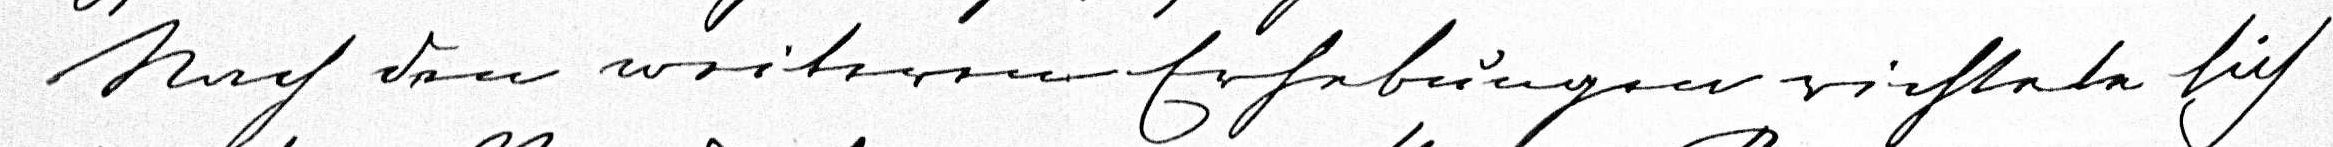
Nach den weiteren Erhebungen richtete sich
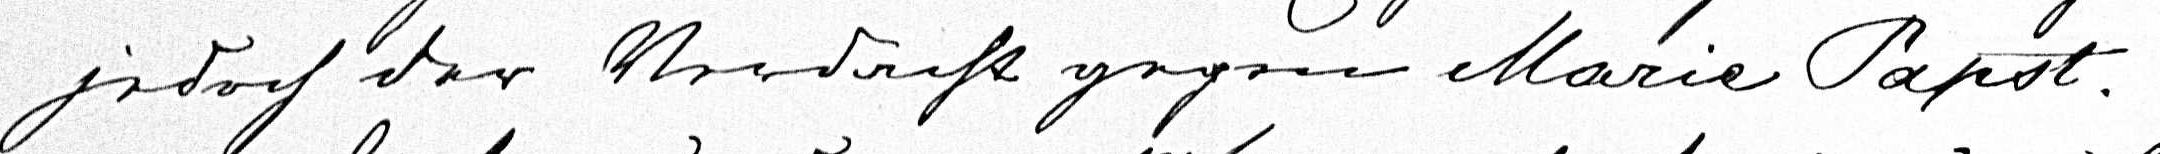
jedoch der Verdacht gegen Marie Papst.
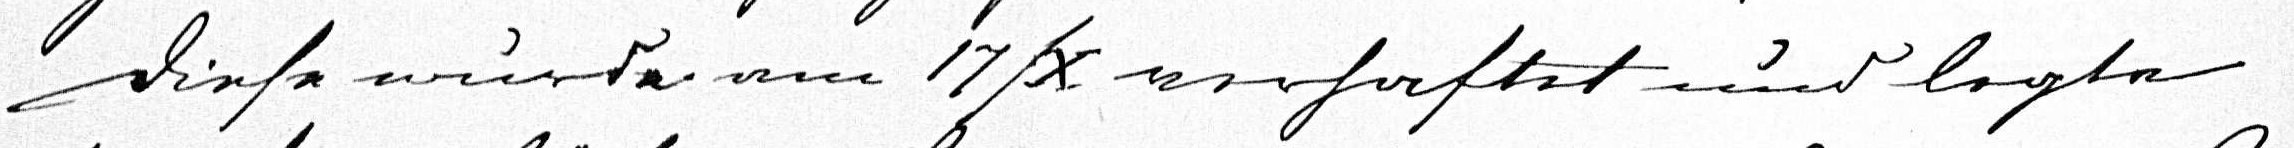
Diese wurde am 17/X verhaftet und legte
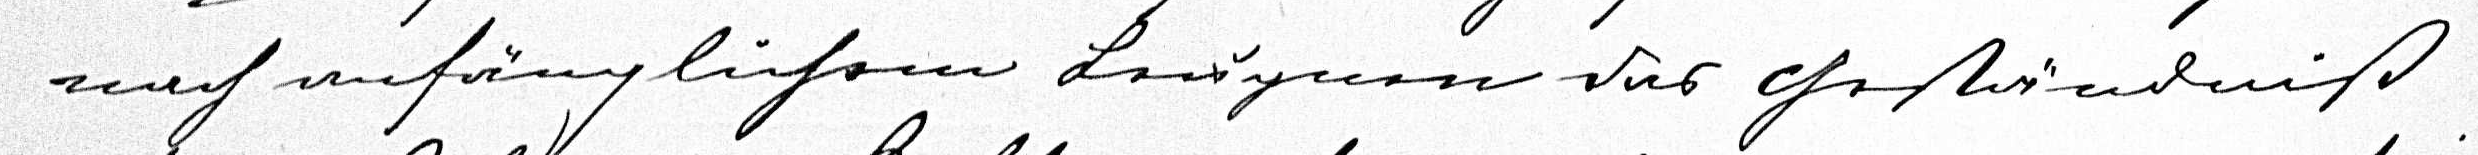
nach anfänglichen Leugnen das Geständniß
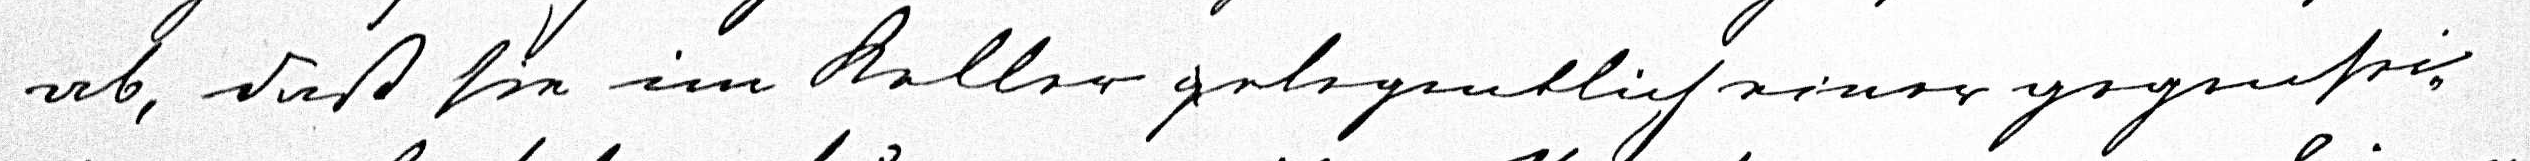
ab, daß sie im Keller gelegentlich einer gegensei¬
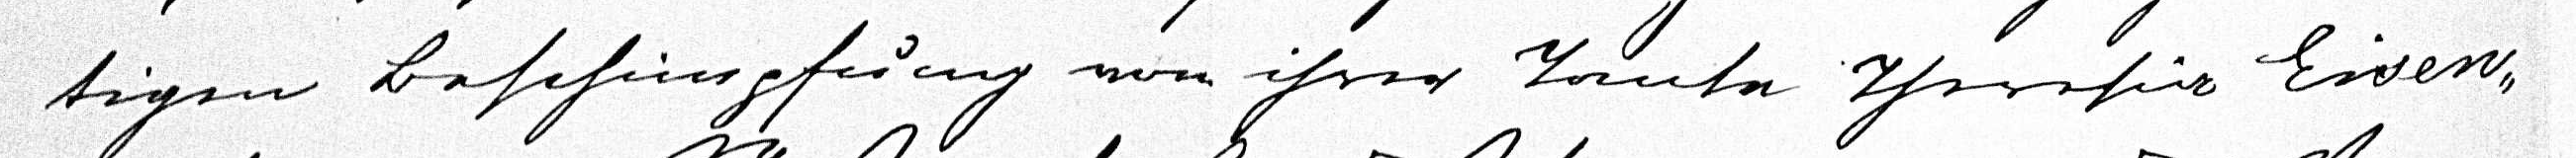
tigen Beschimpfung von ihrer Tante Theresie Eisen¬
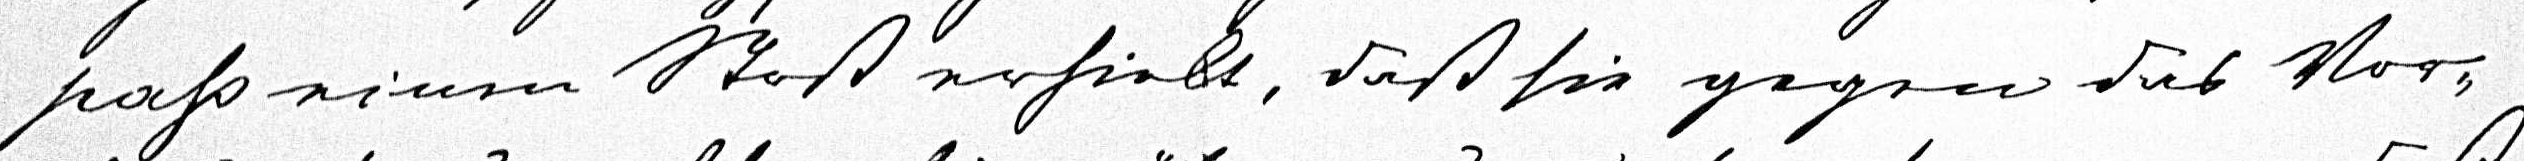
pass einen Stoß erhielt, daß sie gegen das Vor¬
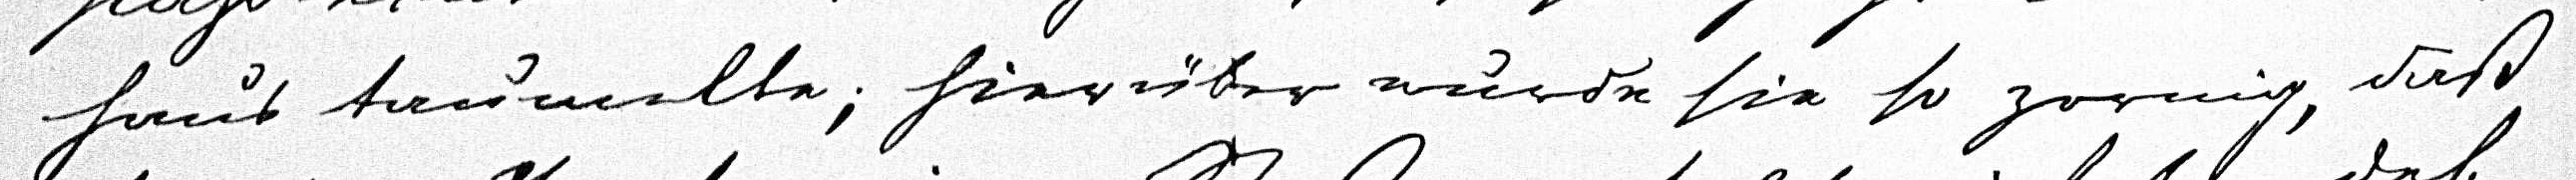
haus taumelte; hierüber wurde sie so zornig, daß
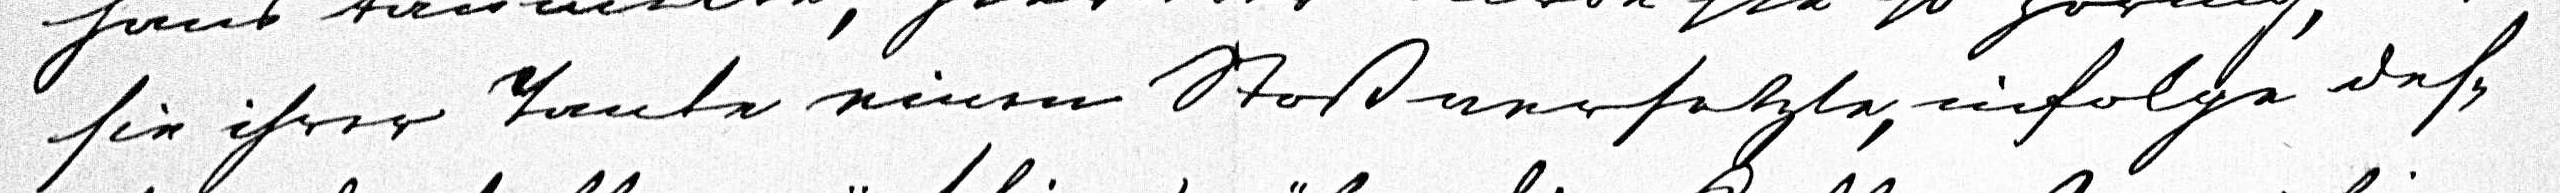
sie ihrer Tante einen Stoß versetzte, infolge des¬
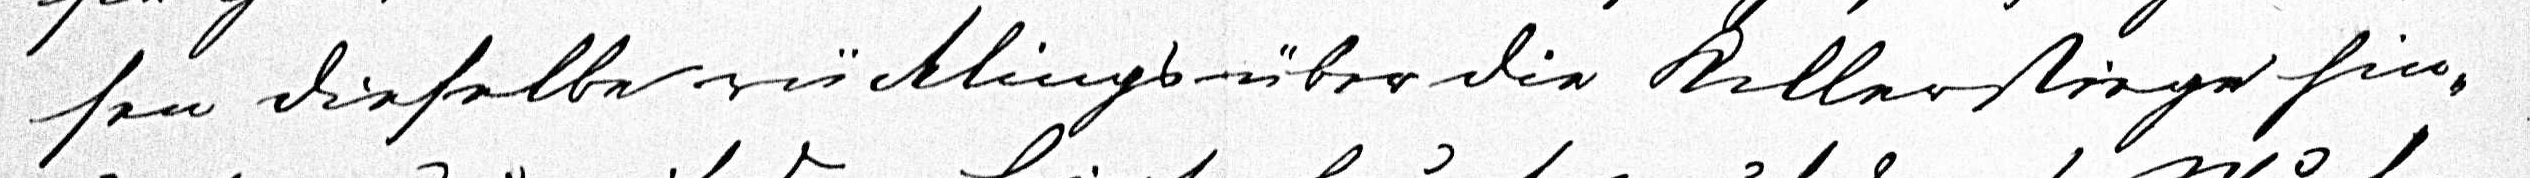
sen dieselbe rücklings über die Kellerstiege hin¬
